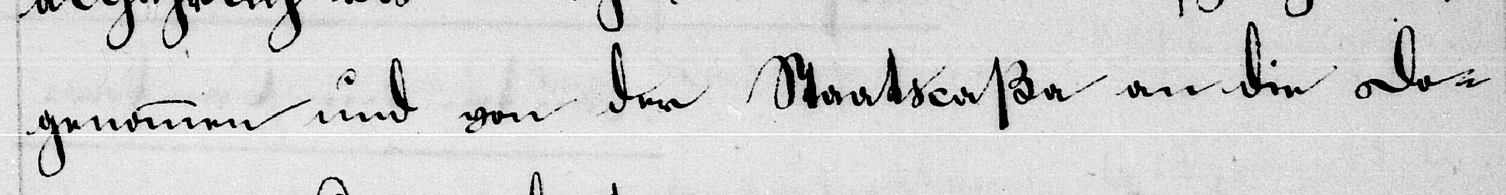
genommen und von der Staatscaßa an die Do¬
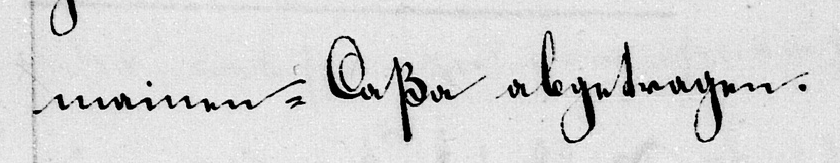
mainen-Caßa abgetragen.
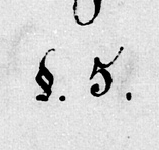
§. 5.
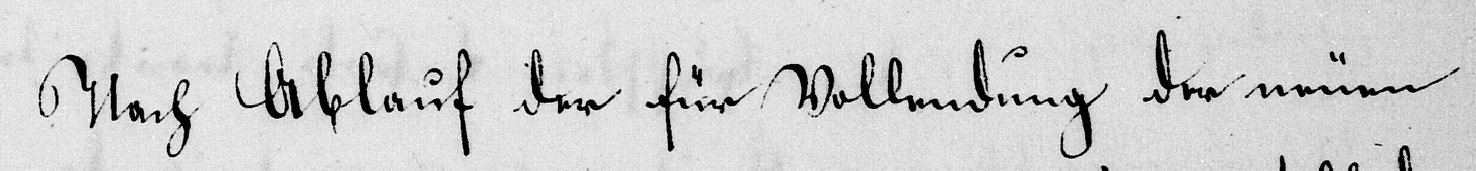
Nach Ablauf der für Vollendung der neuen
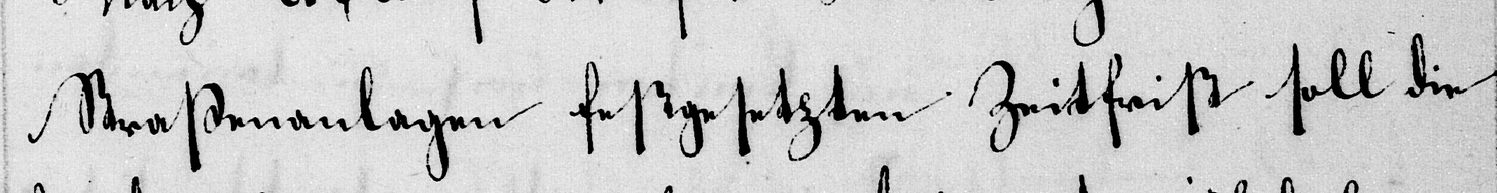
Straßenanlagen festgesetzten Zeitfrist soll die
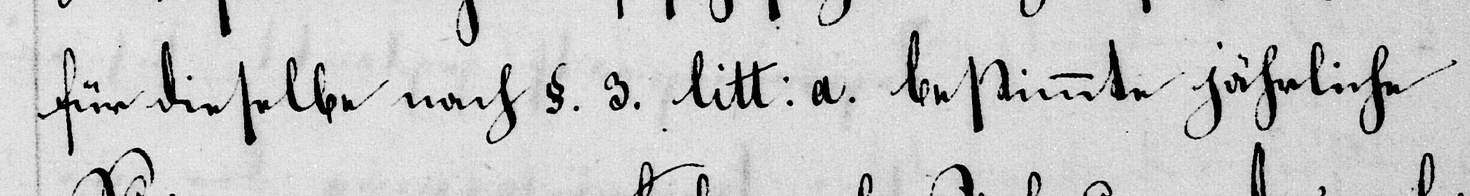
für dieselbe nach §. 3. litt: a. bestimmte jährliche
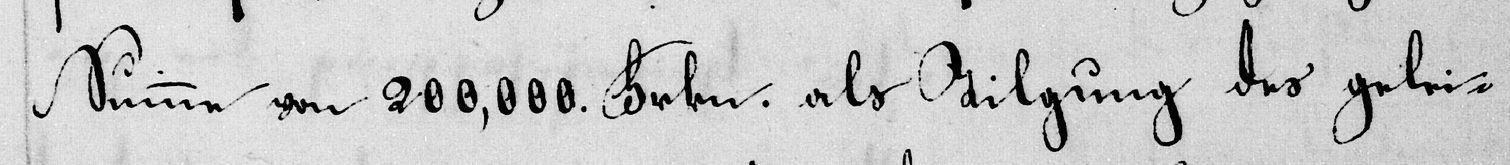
Summe von 200,000. Frkn. als Tilgung des gelei¬
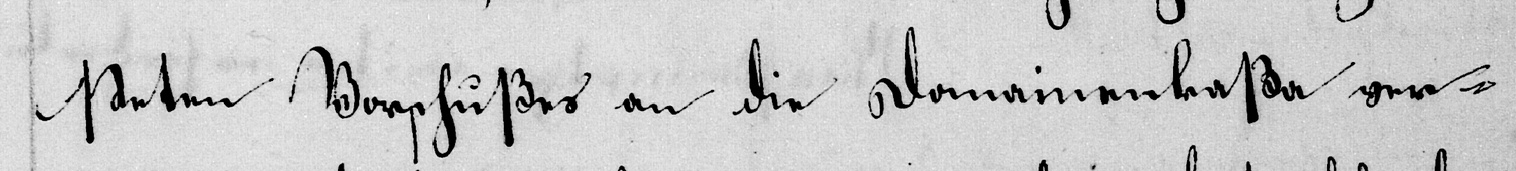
steten Vorschußes an die Domainenkaßa ver¬
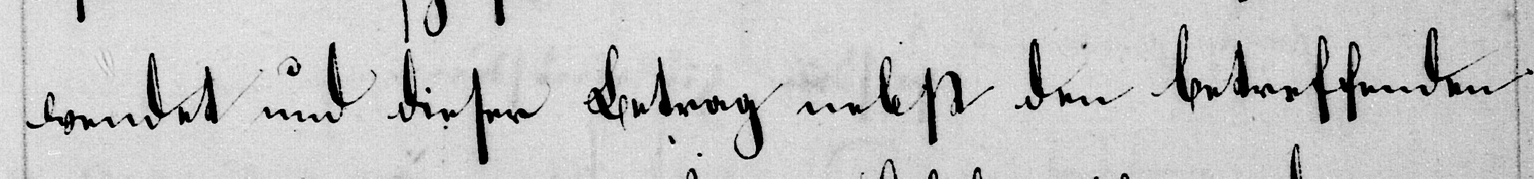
wendet und dieser Betrag nebst den betreffenden
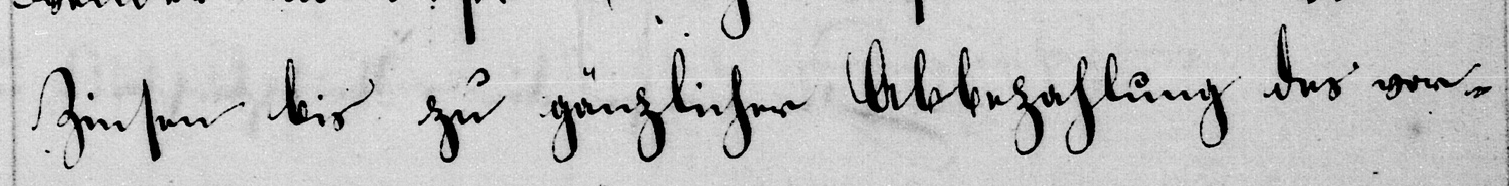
Zinsen bis zu gänzlicher Abbezahlung des vor-
